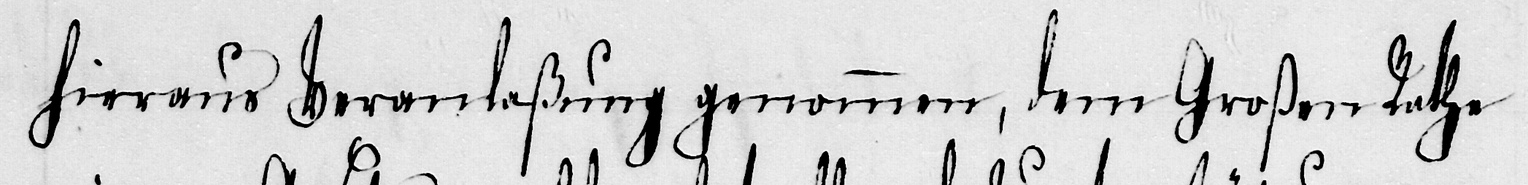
hieraus Veranlaßung genommen, dem Großen Rathe
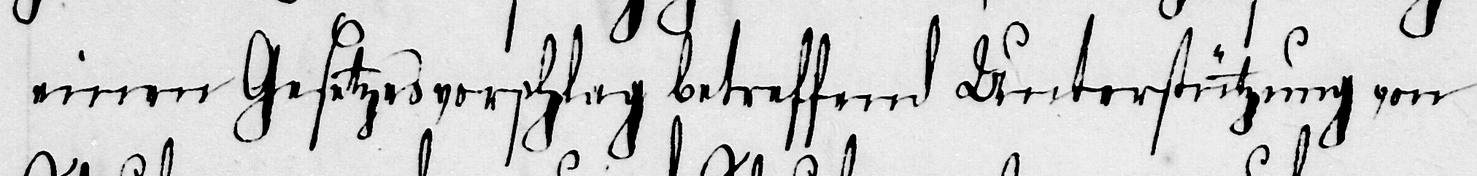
einen Gesetzesvorschlag betreffend Unterstützung von
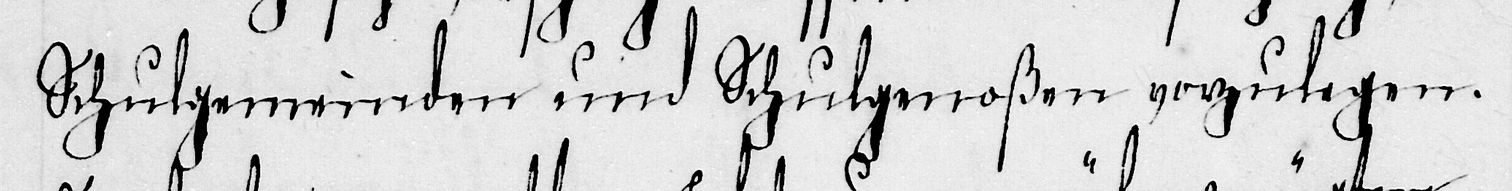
Schulgemeinden und Schulgenoßen vorzulegen.
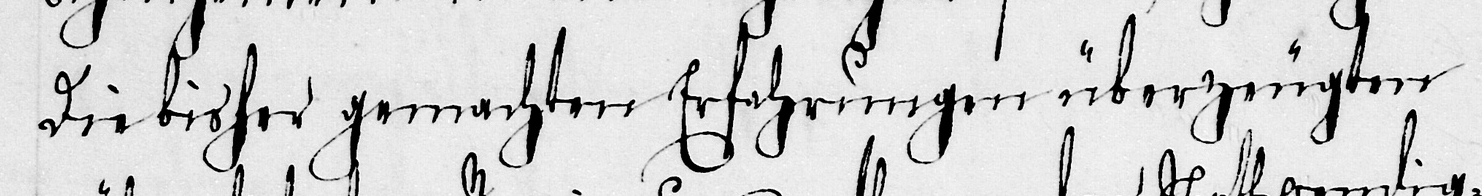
Die bisher gemachten Erfahrungen überzeugten
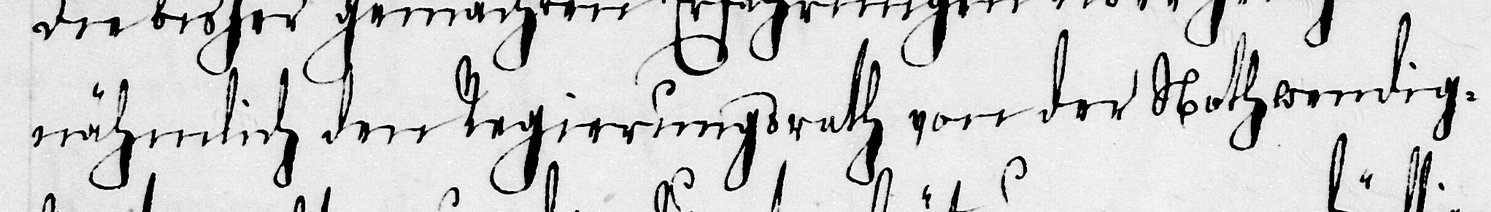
nähmlich den Regierungsrath von der Nothwendig¬
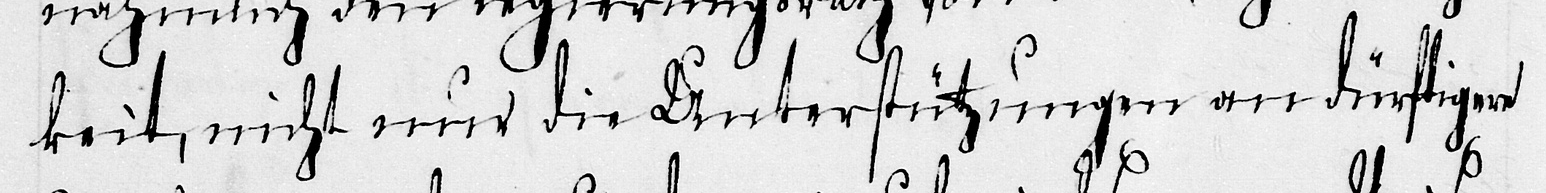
keit, nicht nur die Unterstützungen an dürftigere
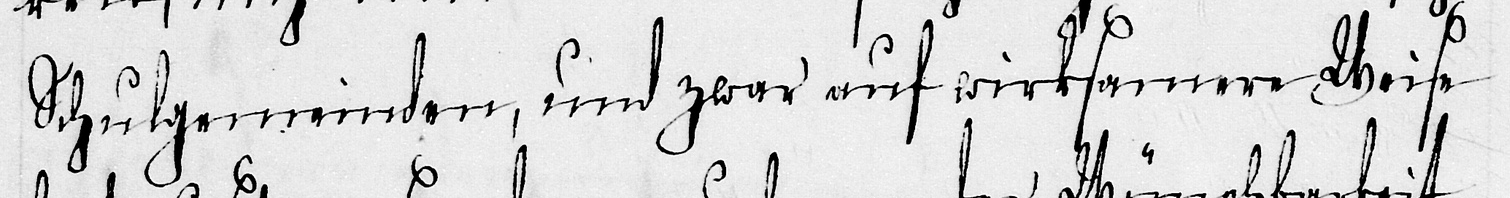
Schulgemeinden, und zwar auf wirksamere Weise
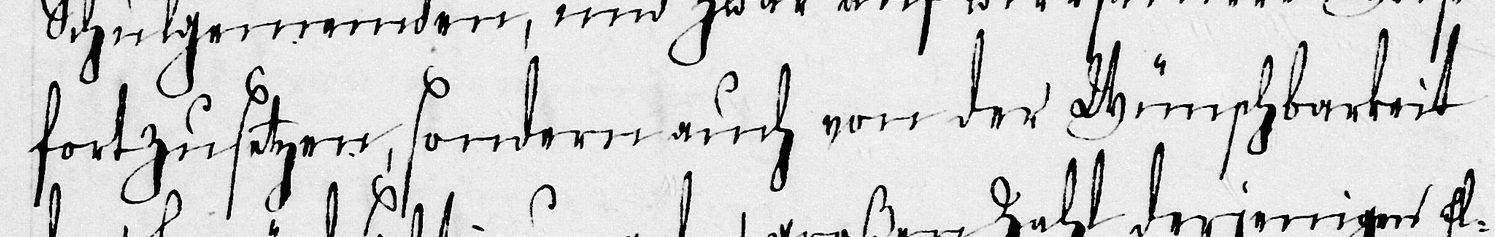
fortzusetzen, sondern auch von der Wünschbarkeit
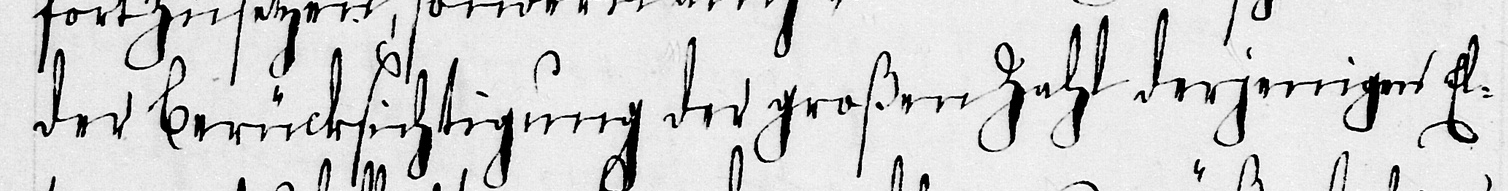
der Berücksichtigung der großen Zahl derjenigen El¬
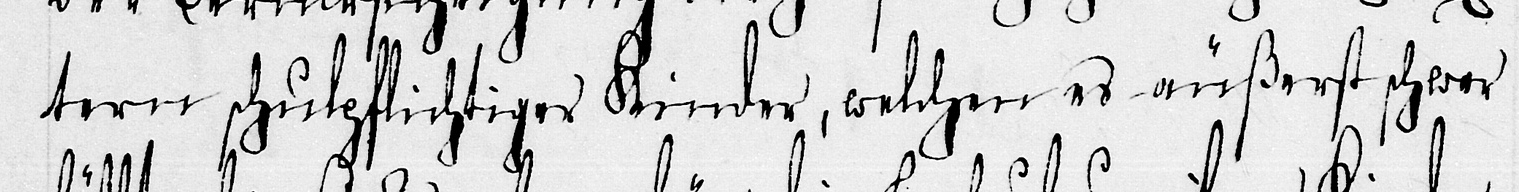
tern schulpflichtiger Kinder, welchen es äußerst schwer
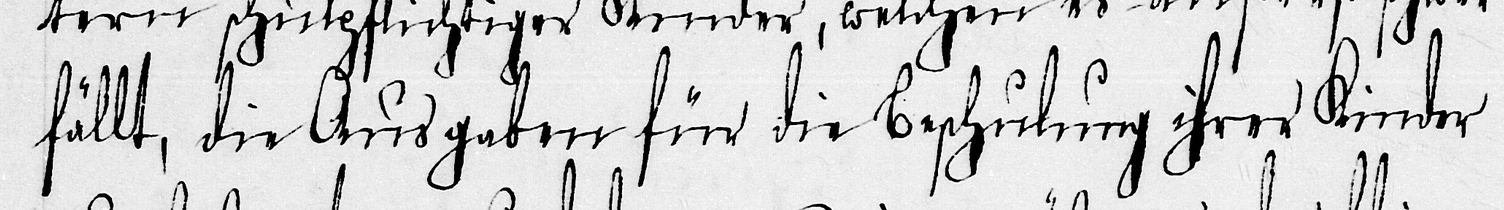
fällt, die Ausgaben für die Beschulung ihrer Kinder
